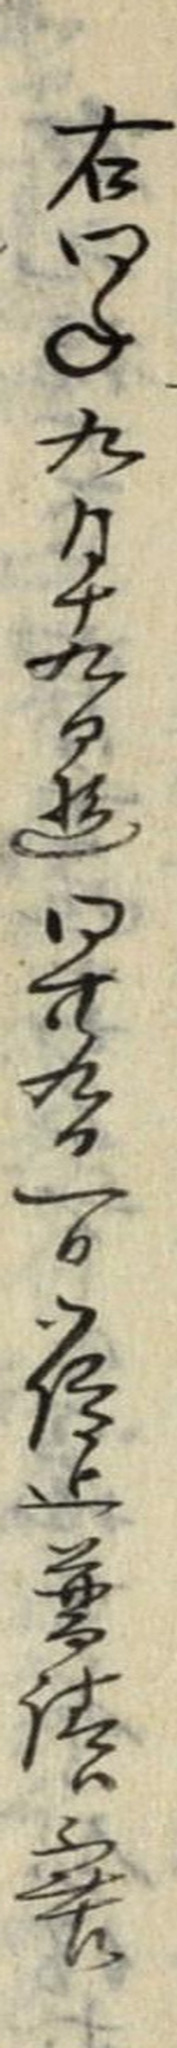右同年九月十九日逝同廿九日一日御停止普請は不苦
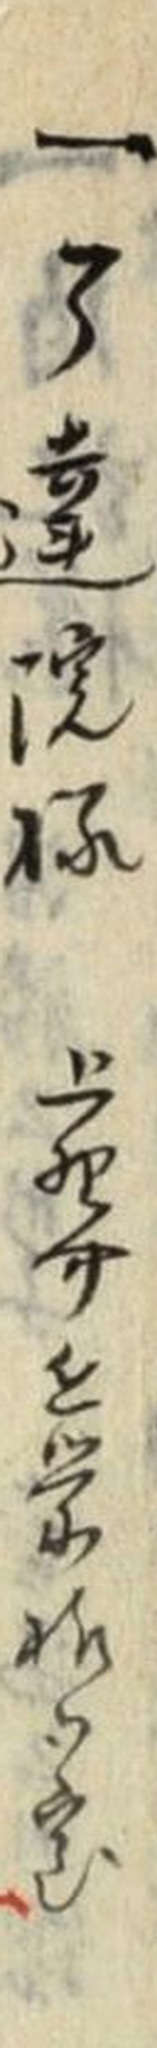一了達院様上野介近栄様御室
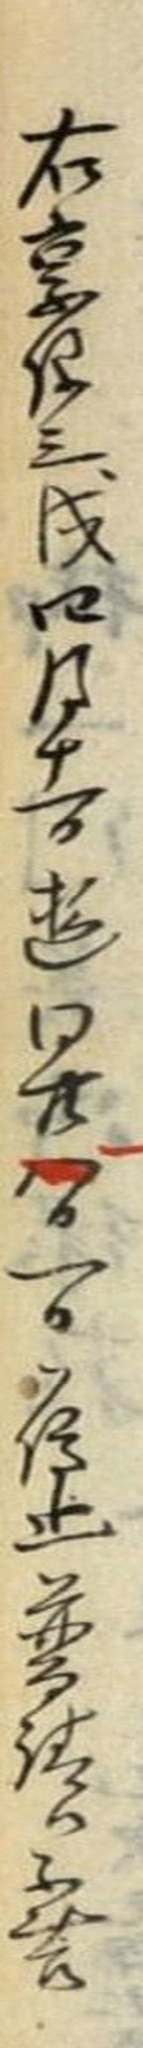右享保三戌四月十一日逝同廿八日一日御停止普請は不苦
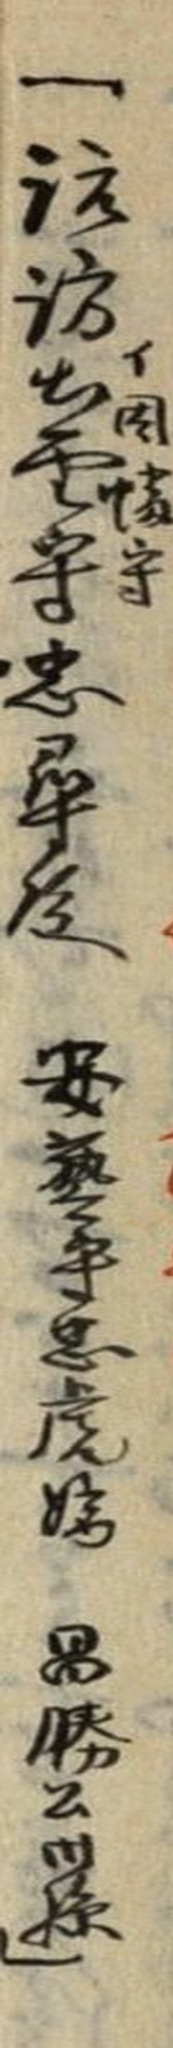一諏訪出雲守忠尋殿安芸守忠虎嫡昌勝公御孫
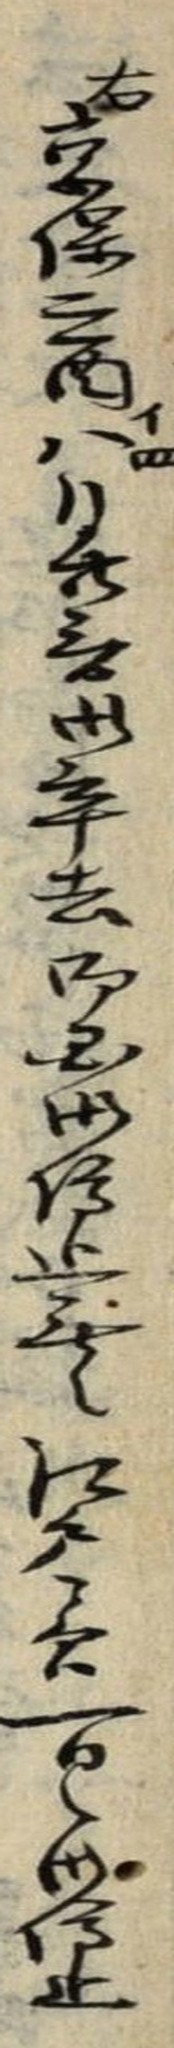右享保二酉八月廿三日御卒去御国御停止無之江戸にては一日之御停止
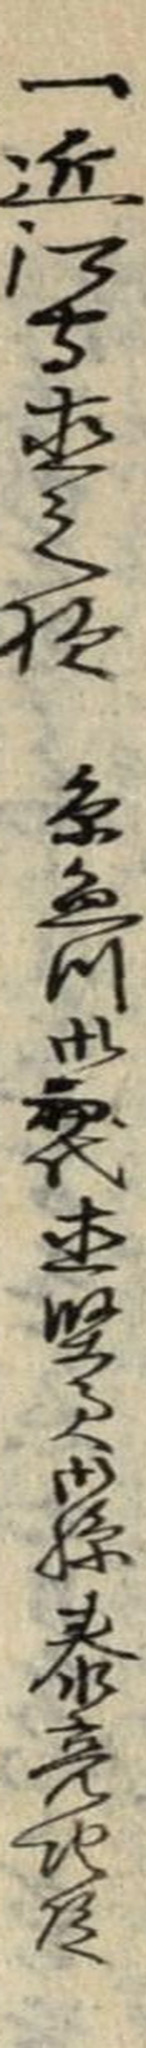一近江守直之様糸魚川初代直堅君御孫泰亮院殿
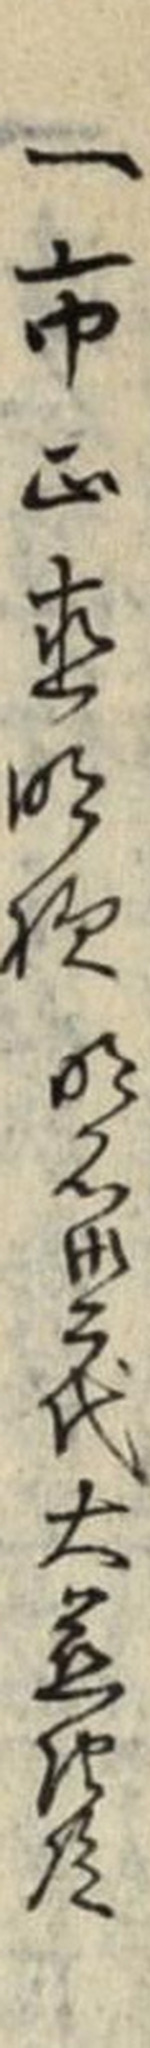一市正直明様明石御二代大慈院殿
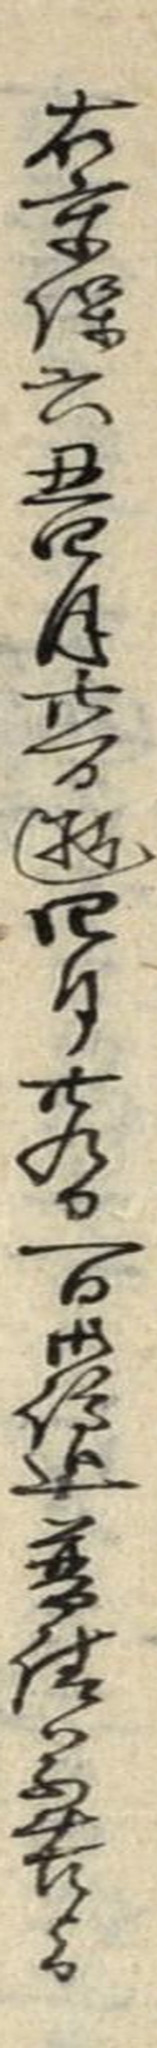右享保六丑四月廿一日逝四月廿九日一日御停止普請は不苦旨
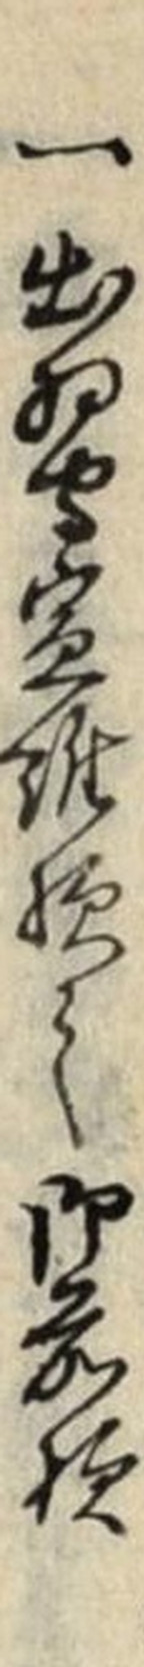一出羽守宣維様之御前様
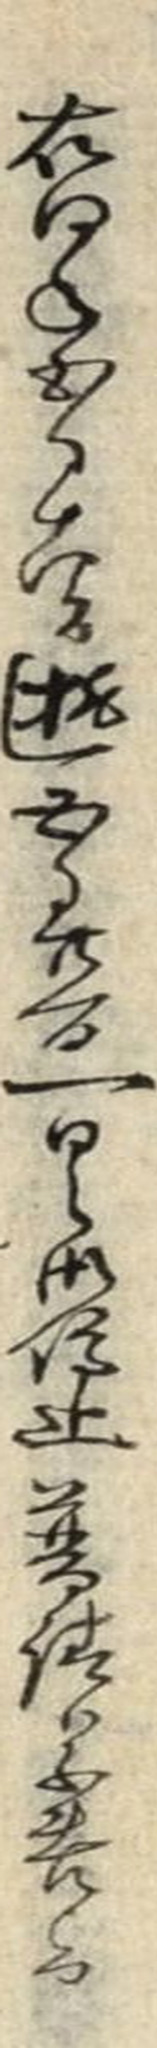右同年五月十四日逝五月廿一日一日之御停止普請は不苦旨
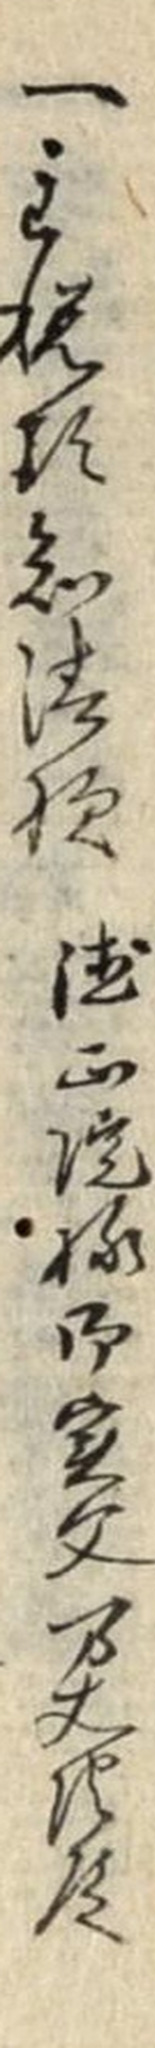一主税頭知清様徳正院様御実父万丈院殿
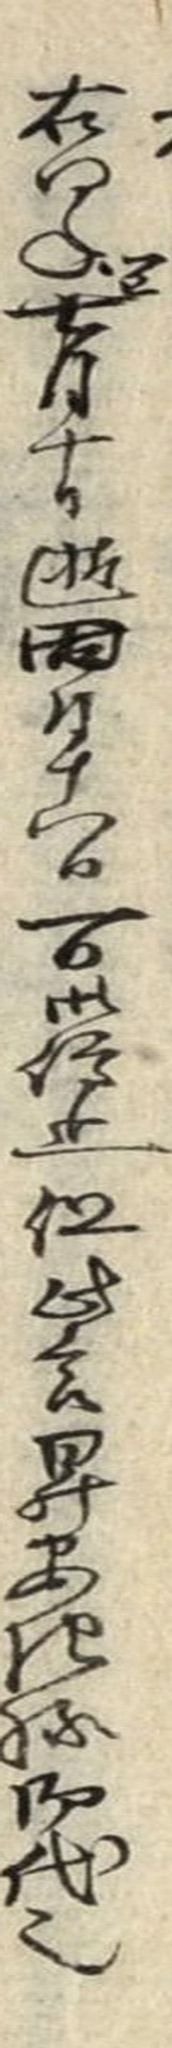右同年閏七月十日逝同月十八日一日御停止但此節昇安院様御代也
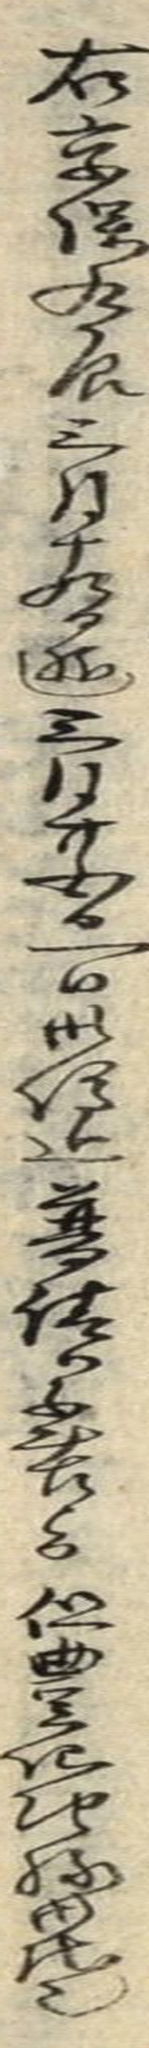右享保九辰三月十九日逝三月廿五日一日御停止普請は不苦旨但豊仙院様御代也

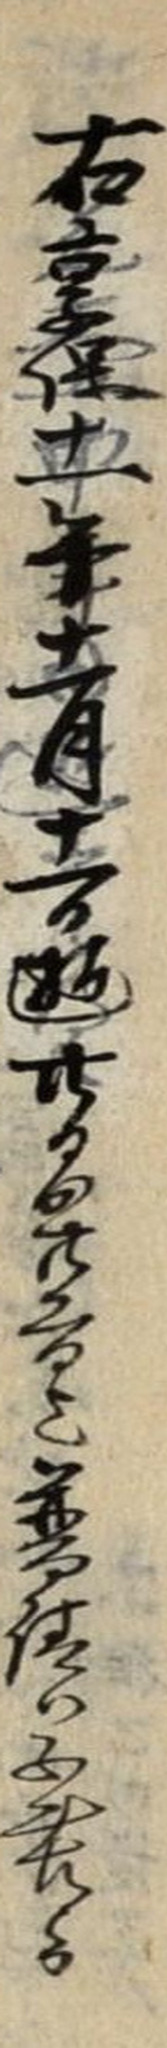右享保十一年十一月十一日逝廿日ゟ廿二日迄普請は不苦旨
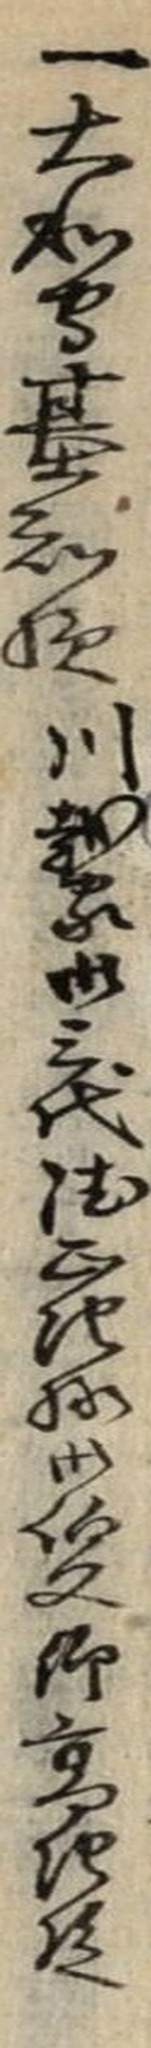一大和守基知様川越家御三代徳正院様御伯父仰高院殿
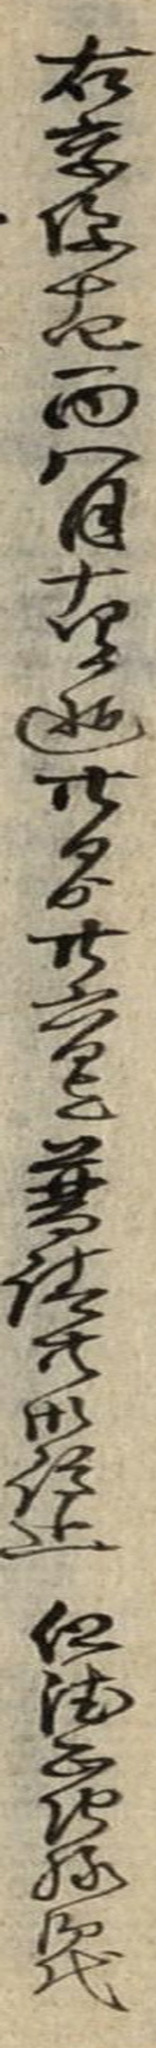右享保十四酉八月十四日逝廿日ゟ廿六日迄普請共御停止但徳正院様御代
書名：御停止異変死失
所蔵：福井県文書館 Fukui Prefectural Archives
